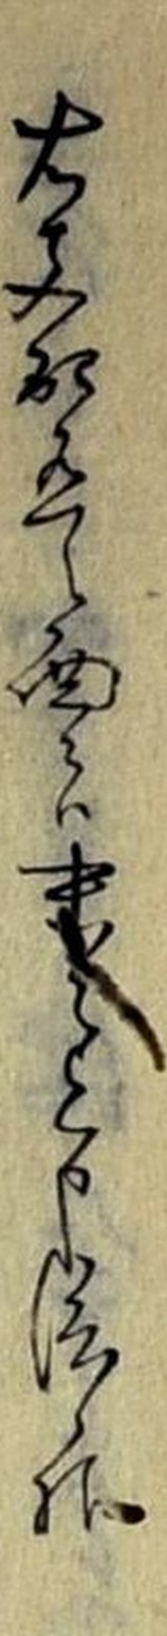右支配有之免面々ハ末々迄申渡候様
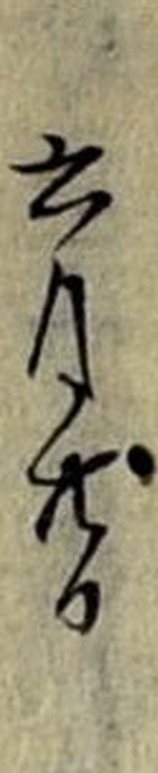六月廿日
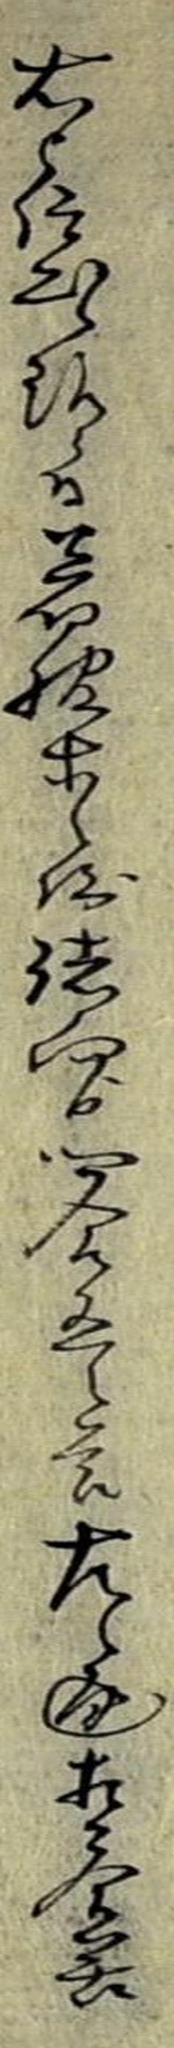右被仰出候趣ニ付着服等之儀諸向ゟ問合有之節左之通相答筈
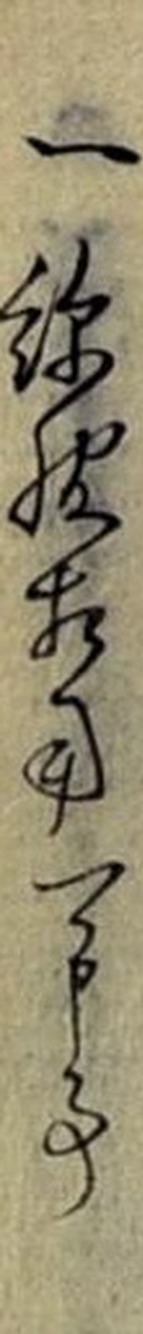一綿服相用可申事
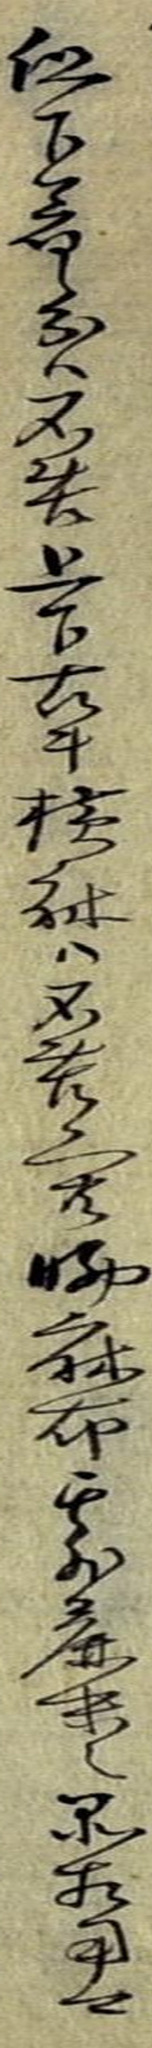但下着之分ハ不苦上下古キ横麻ハ不苦候ヘ共晒麻布其外麁末之品相用可
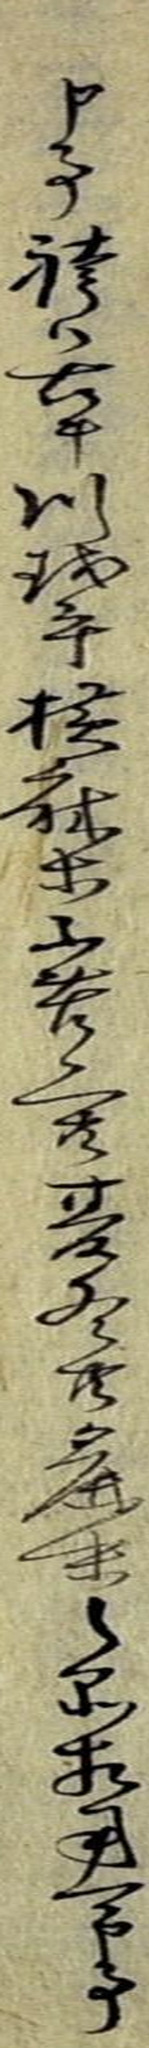申事袴ハ古キ川越平横麻等不苦候へ共夏冬共麁末之品相用可申事
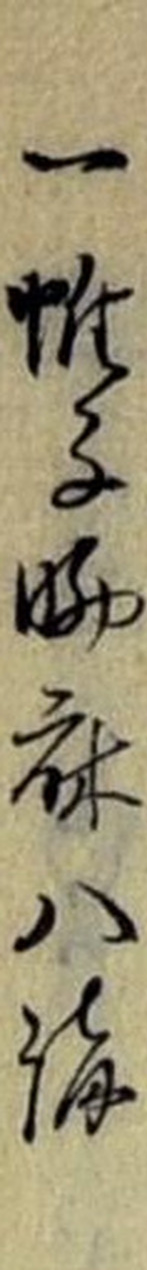一帷子晒麻八講
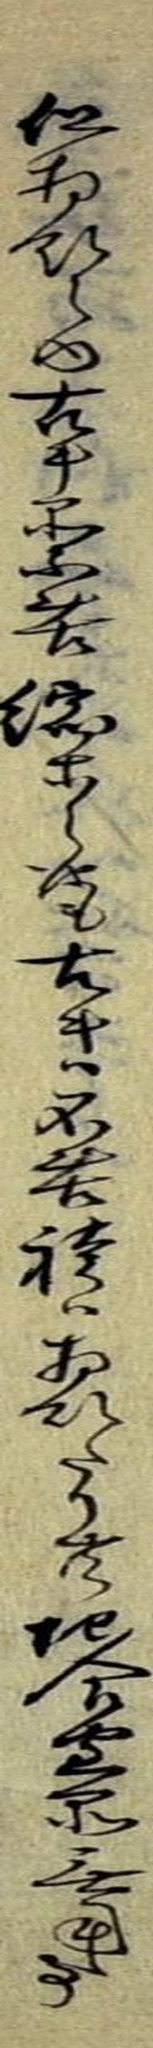但拝領之内古キ品不苦縮等之儀も古キハ不苦袴ハ拝領たり共地合宜品無用之事
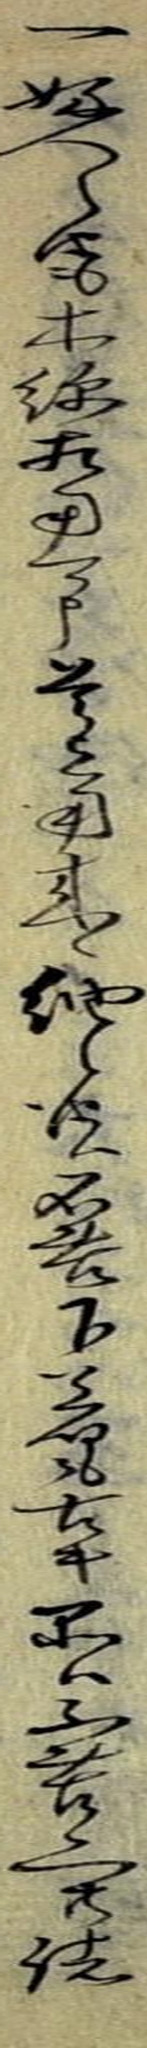一婦人之儀も木綿相用可申是迄用来候紬之儀ハ不苦下着も古キ品ハ不苦候へ共諸
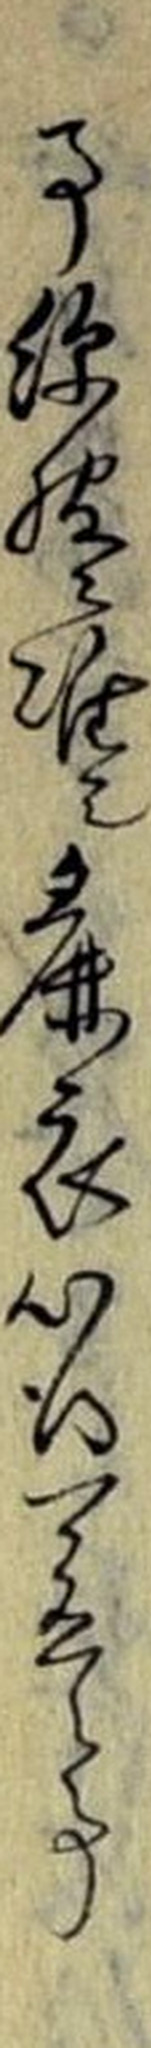事綿服ニ准シ麁衣心得可有之事
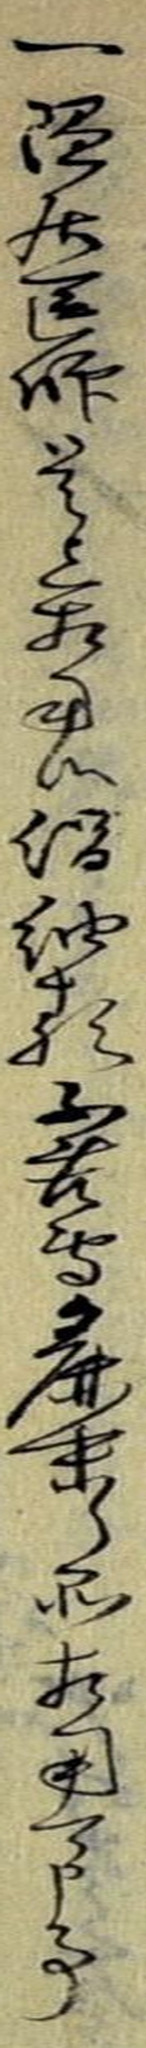一隠居医師是迄相用候絽類不苦専麁抹之品相用可申事
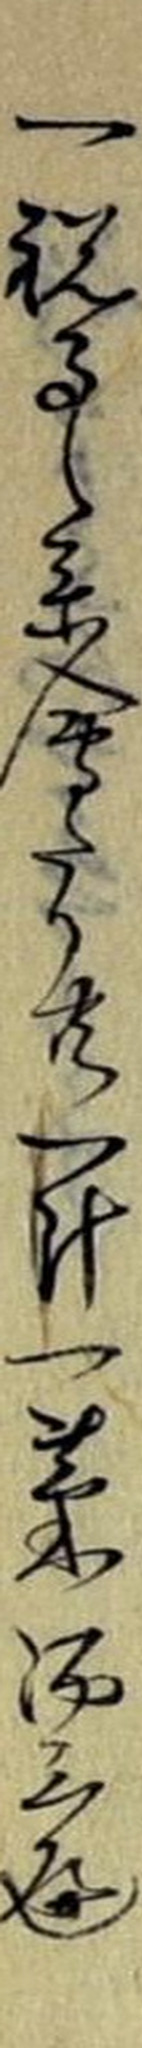一祝事之参会たり共一汁一菜酒三返
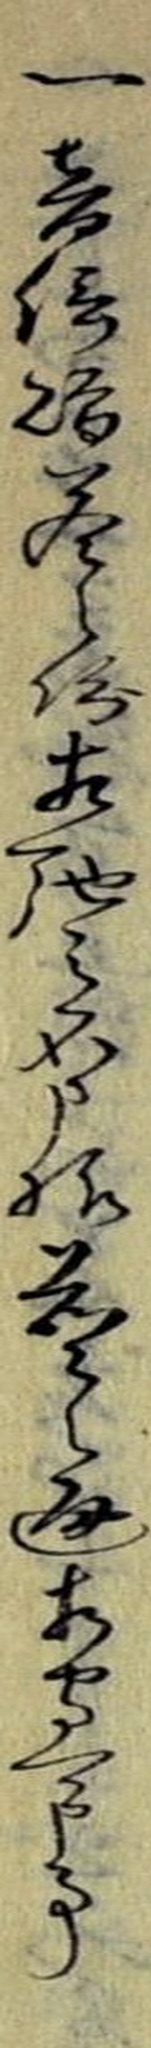一音信贈答之儀相弛ミ不申様前々之通相守可申事
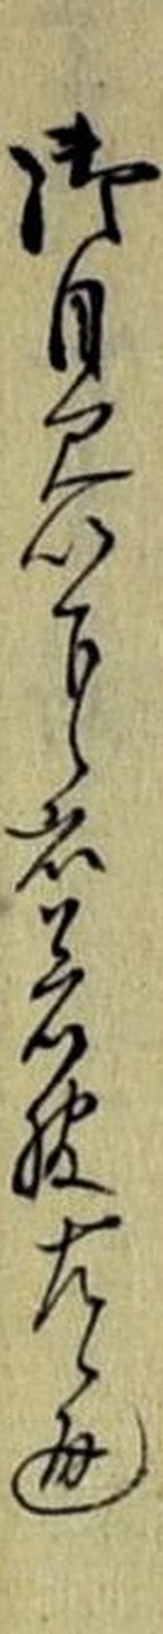御目見以下之者着服左之通
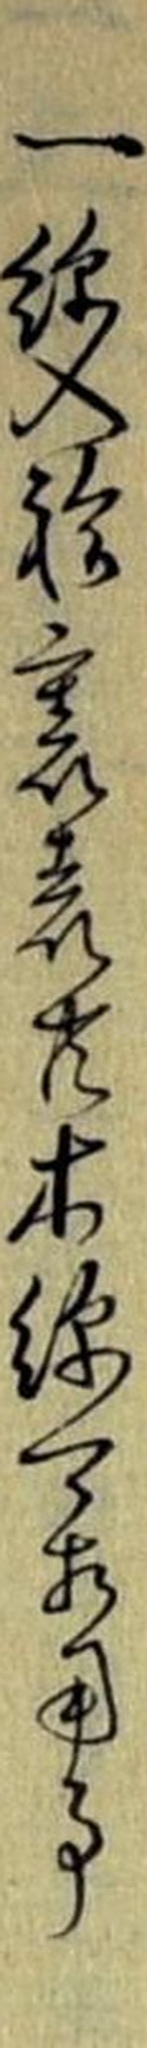一綿入袷裏表共木綿可相用事
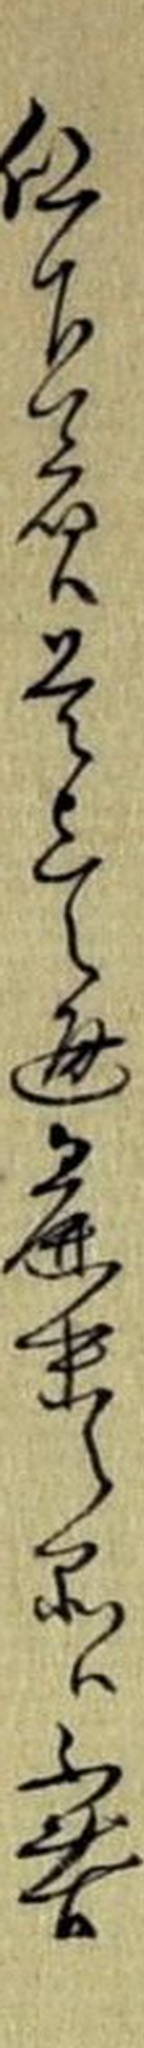但下着ハ是迄之通麁末之品ハ不苦
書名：命令之部 五
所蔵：福井県文書館 Fukui Prefectural Archives
